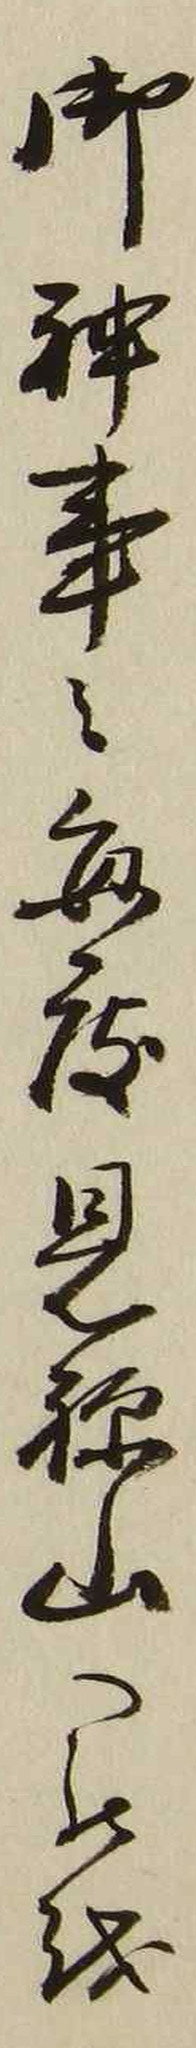御神事之毎度見祢山へ罷越
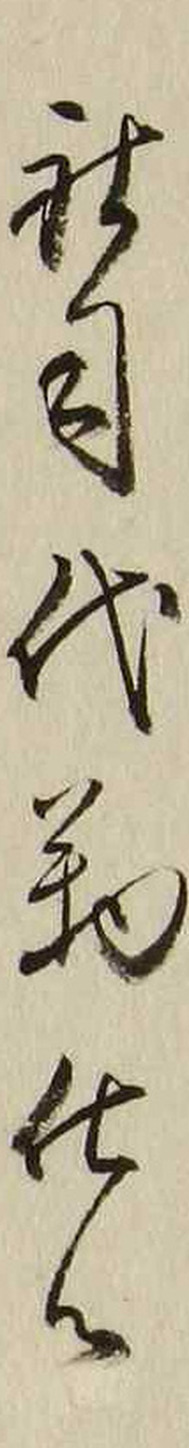社司代勤仕候
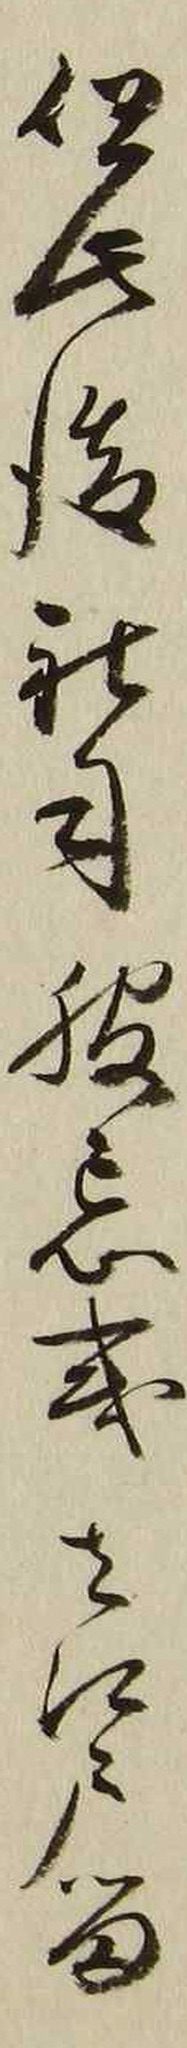但此後社司服忌或者江戸留
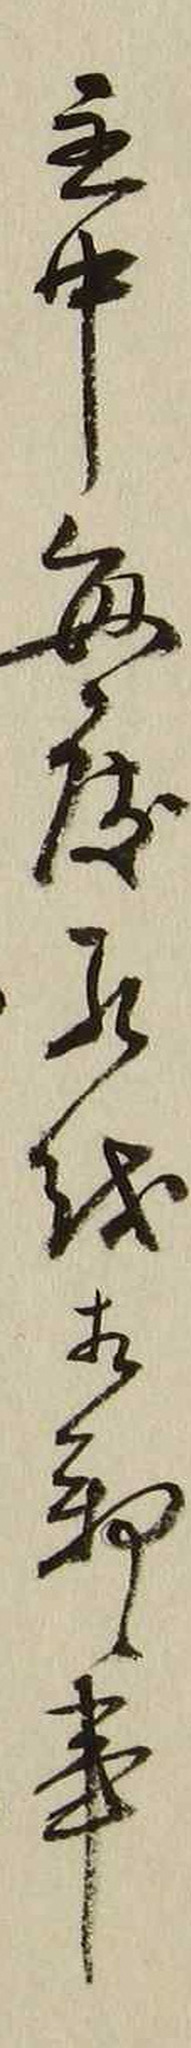主中毎度罷越相勤候事
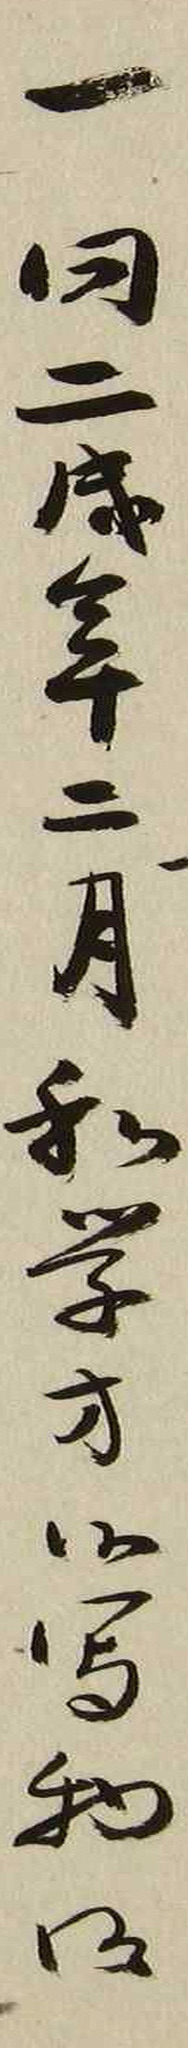一同二戌年二月和学方御写物御
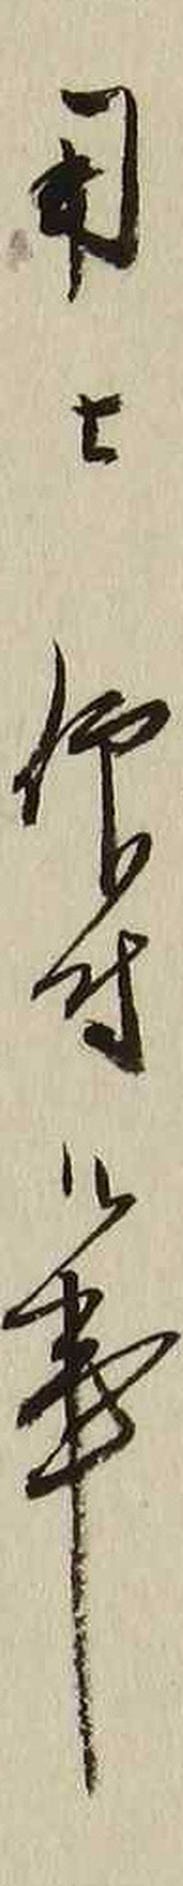用被仰付候事
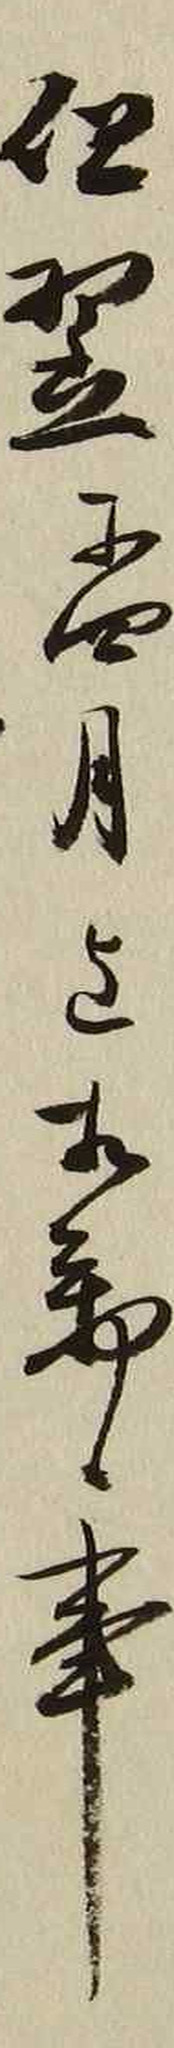但翌子四月迄相勤候事
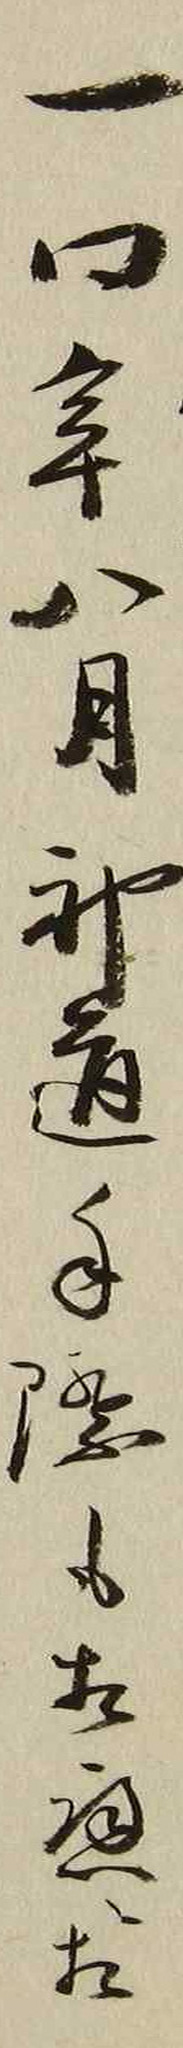一同年八月神道手際も相応ニ相
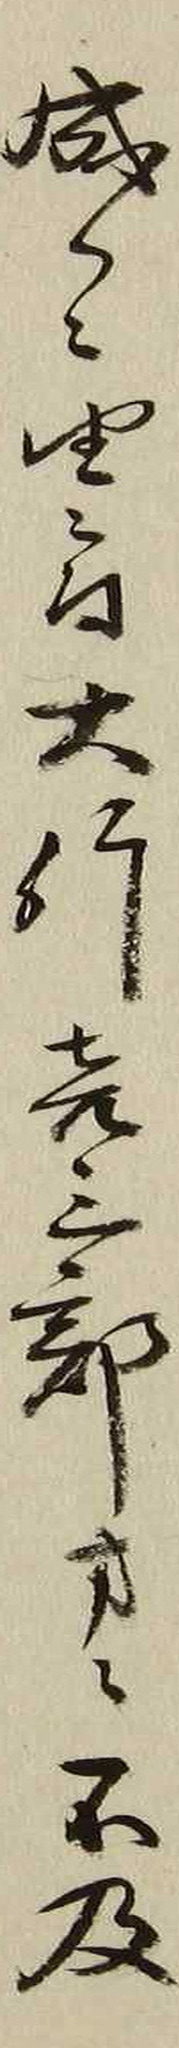成候ニ由ニ付大竹喜三郎方ニ不及
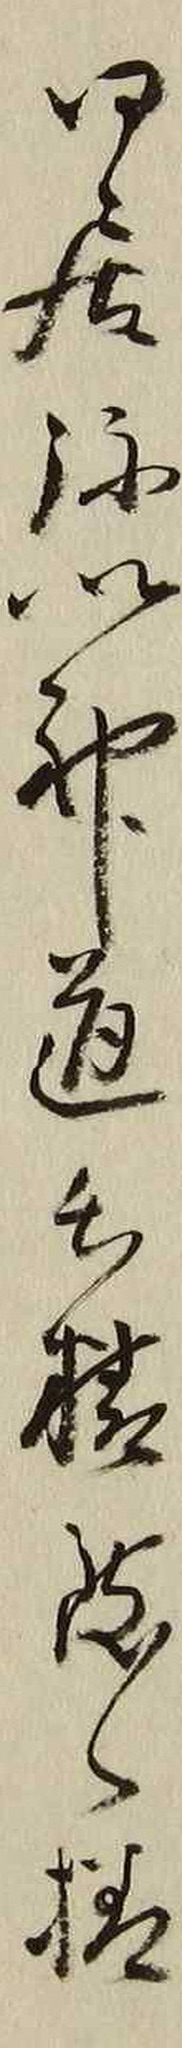同居弥以神道出精致候様
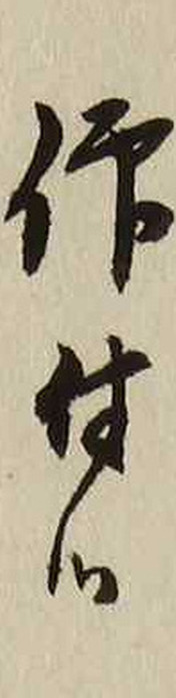仰付候
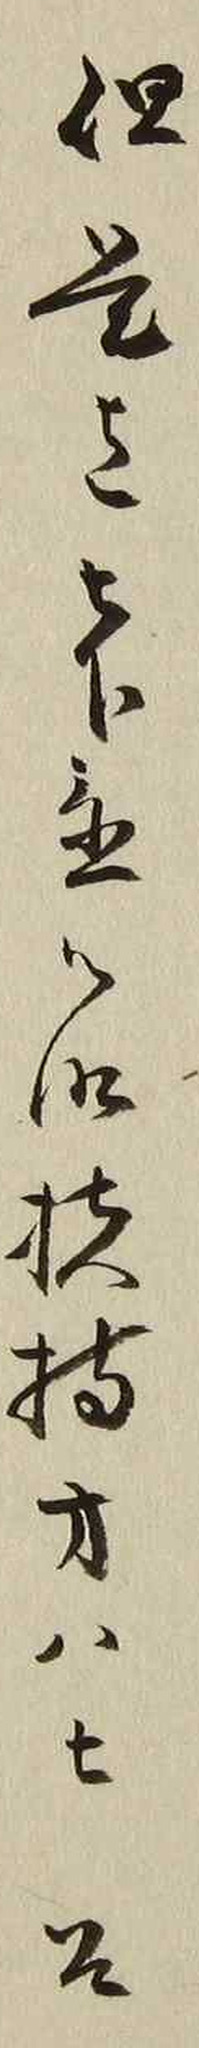但是迄被下置候御扶持方ハ被召
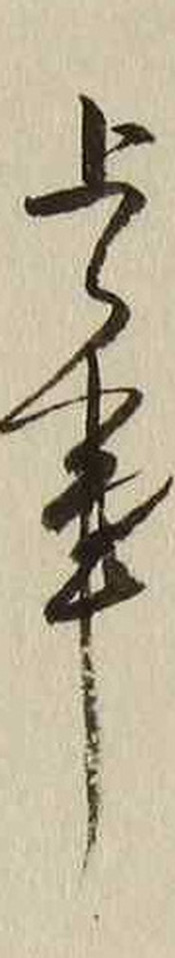上候事
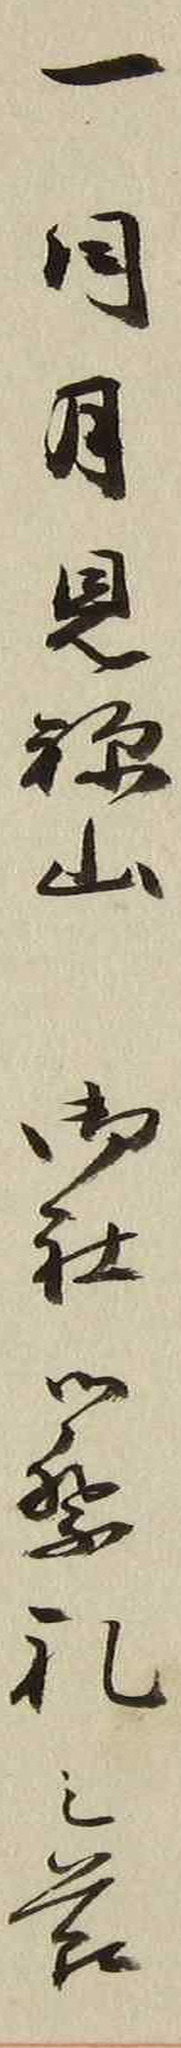一同月見祢山御社御祭礼之節
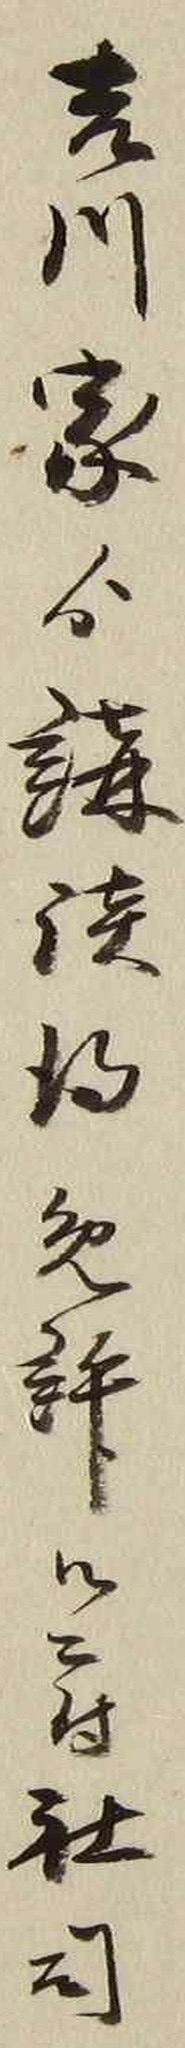吉川家ゟ講談得免許候ニ付社司
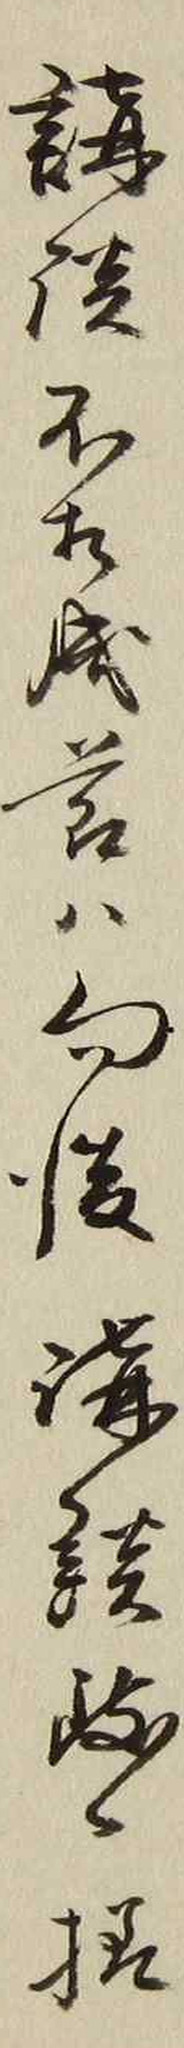講談不相成節ハ向後講談致候様
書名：諸士系譜　巻之291　さ之部23
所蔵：会津若松市立会津図書館
